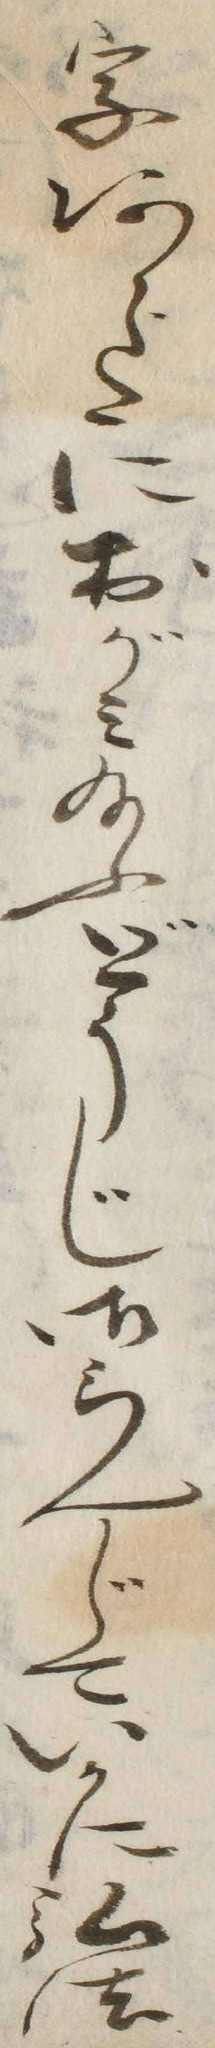字あらたにおがみ給ふどうじ御らんじていかに弘法
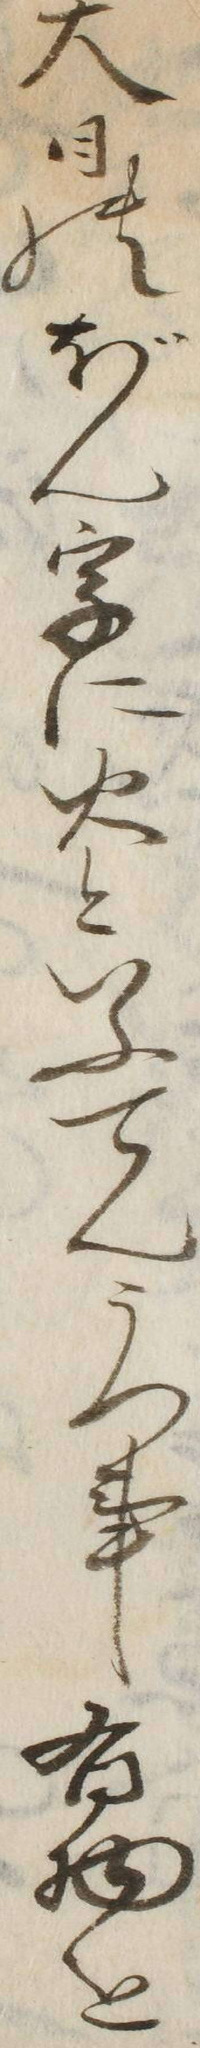大日のぼん字に火といふてんうつ事有物を
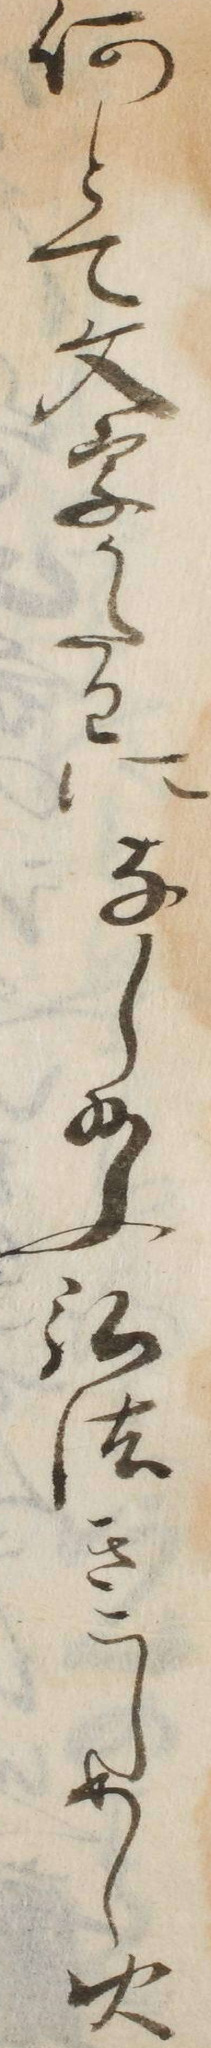何とて文字かたわになし給ふ弘法きこしめし火
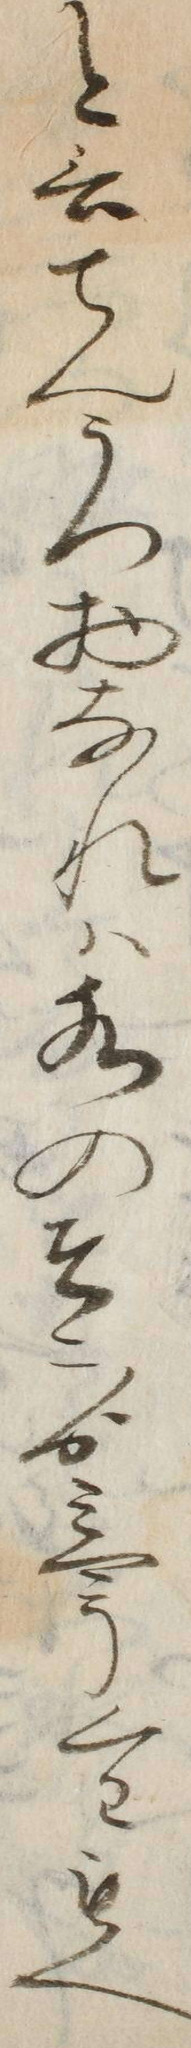と云てんうつ物なれは水のそこよりみやうくわもへ
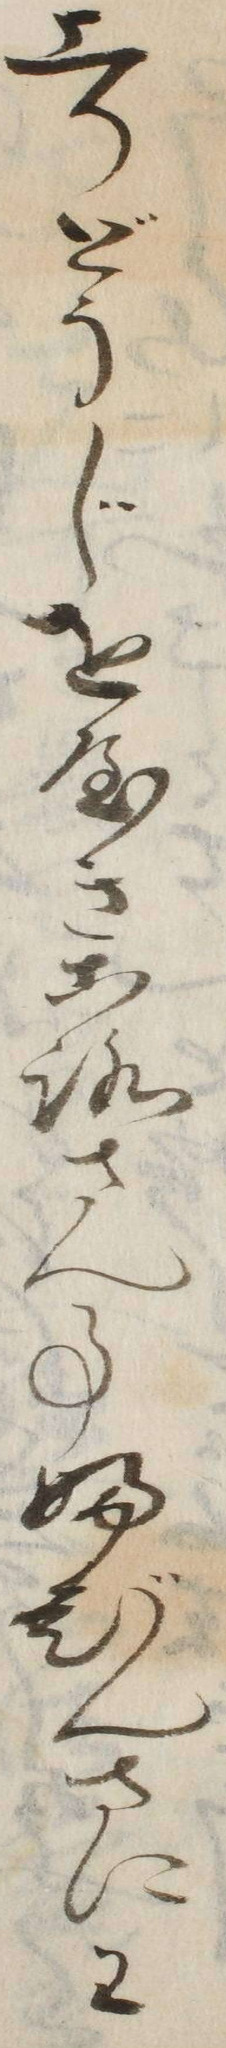上りどうじをやきころさん事ふびんさにわ
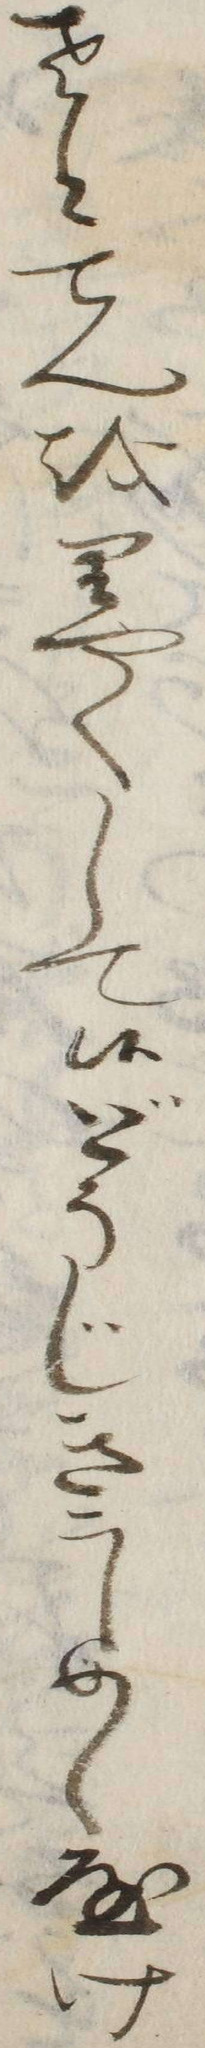さとてんをりやくして候どうじきこしめしやけ
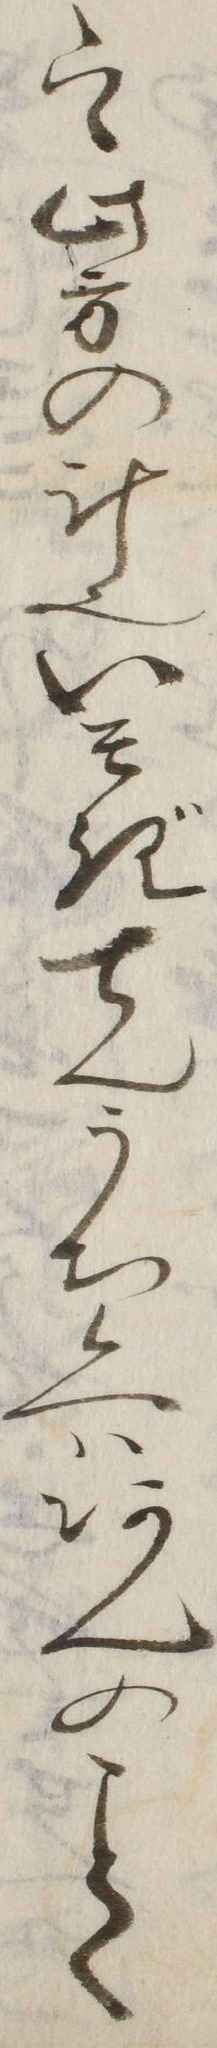候はゝ此方の計也いそぎてんうち候へはあんのことく
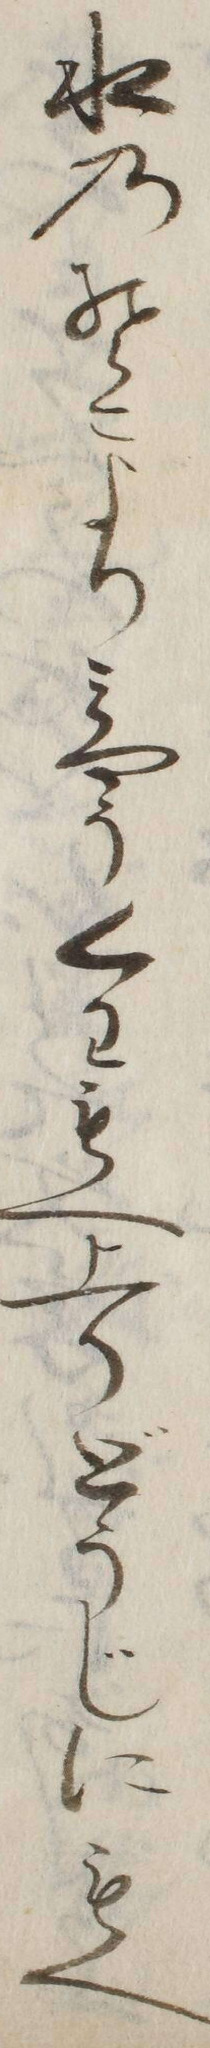水のそこよりみやうくわもへ上りどうじにもへ
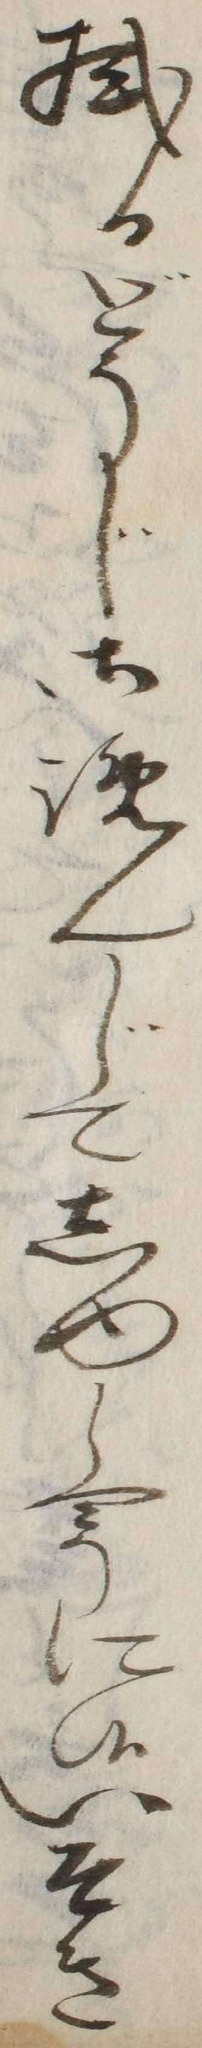掛るどうじ御覧んじてしゆしやうに候いそき
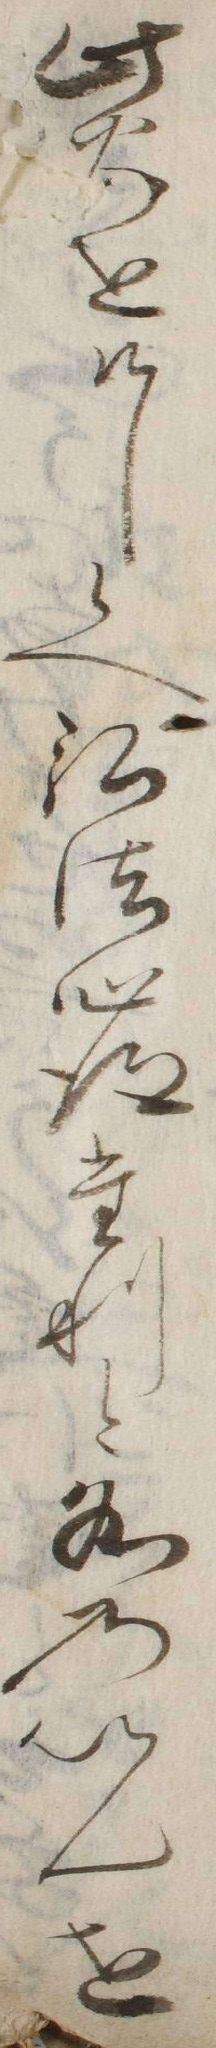此火をけし候へ弘法心得たりと水のいんを
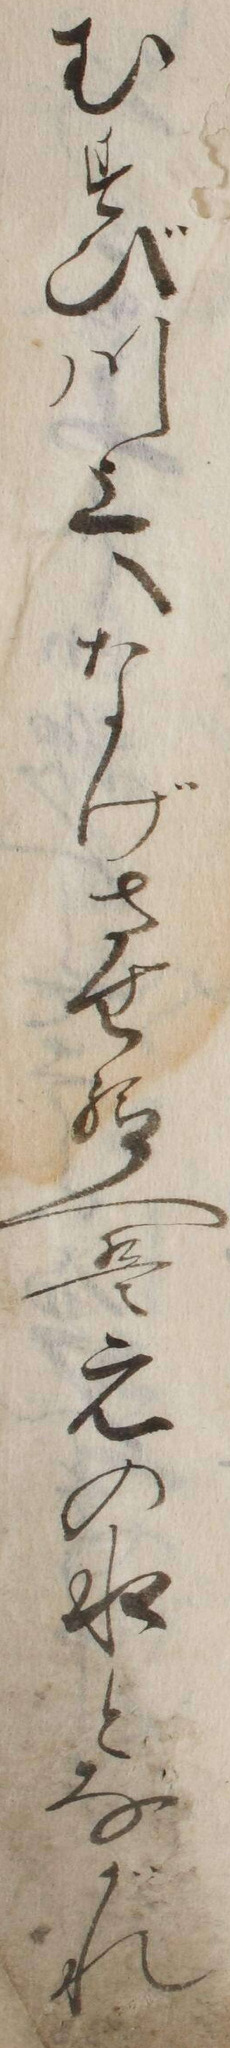むすび川上へなげさせ給へは元の水とながれ

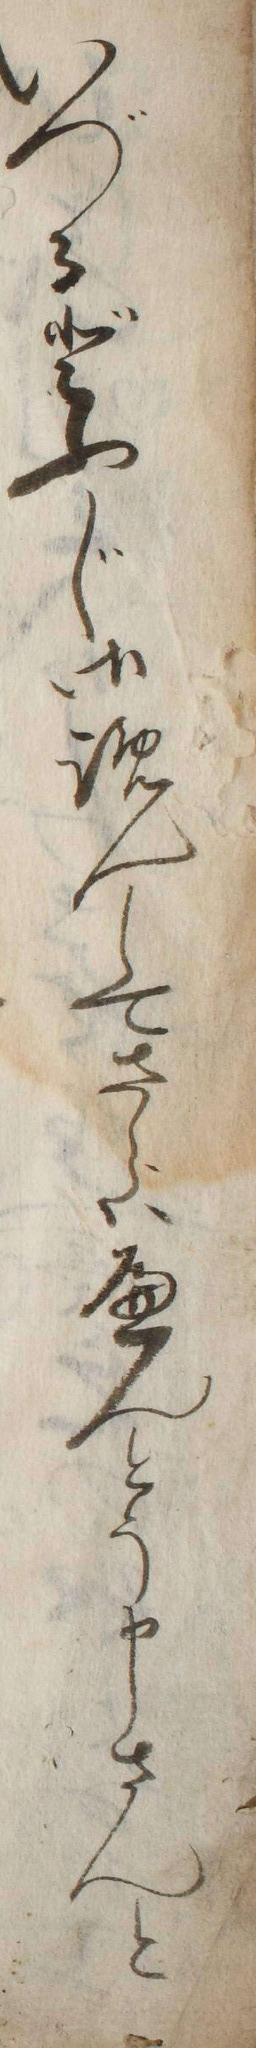いづるどふじ御覧んしてさらはへんとう申さんと
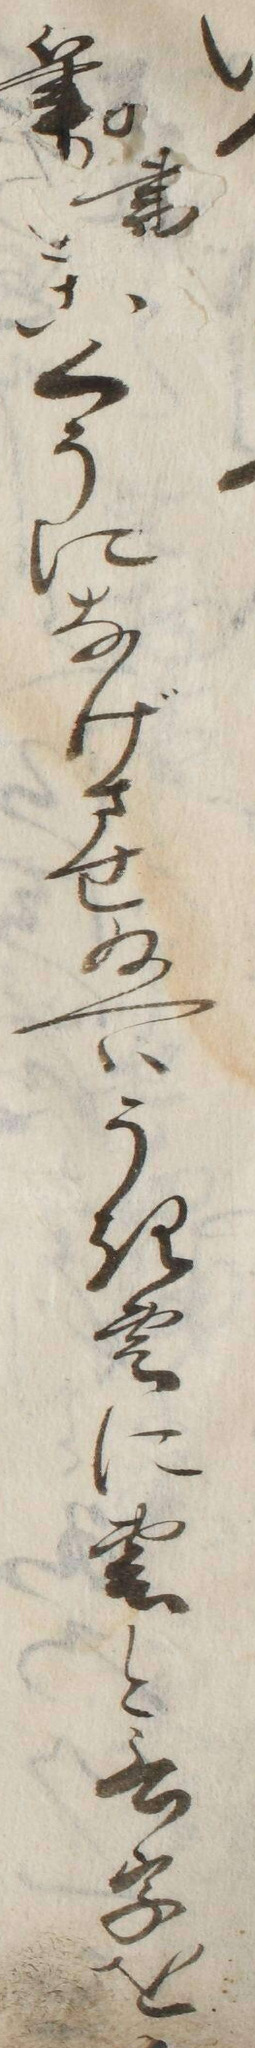筆こくうになげさせ給へはうき雲に雲と言字を
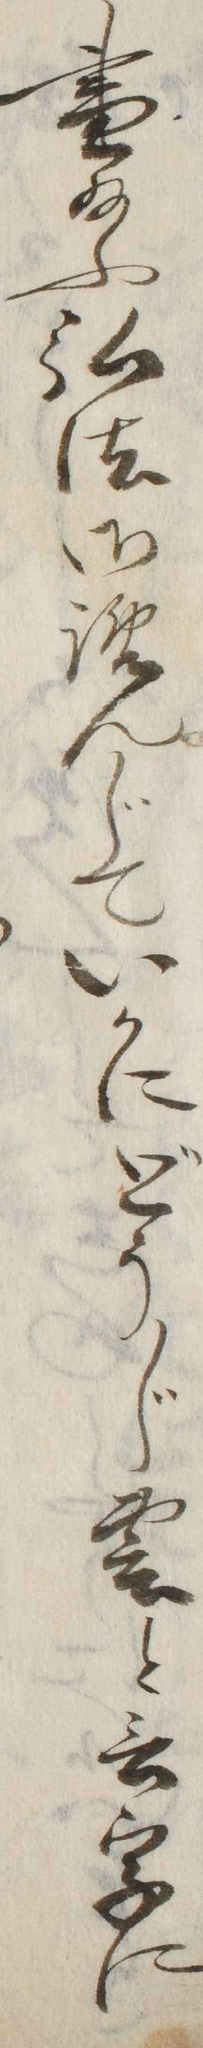書給ふ弘法御覧んじていかにどうじ雲と言字に
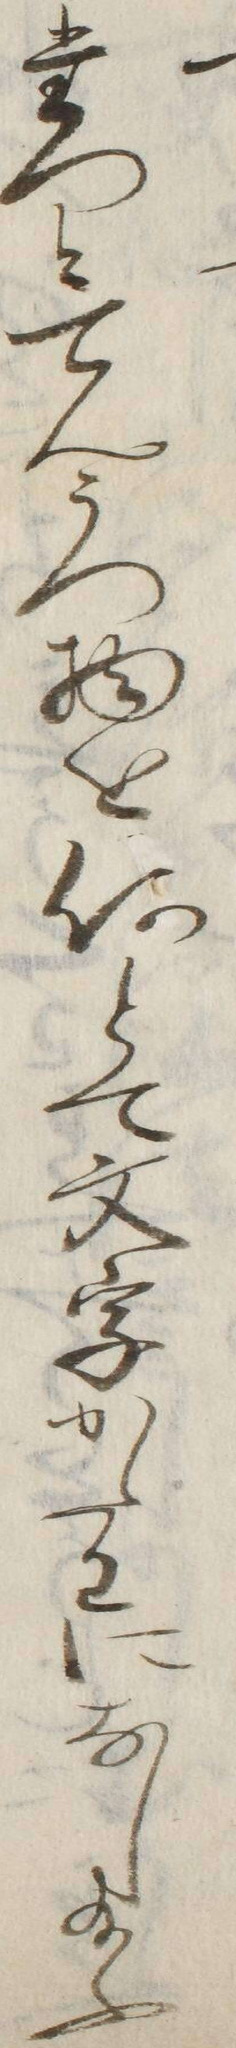たつとてんうつ物を何とて文字かたわになし給ふ
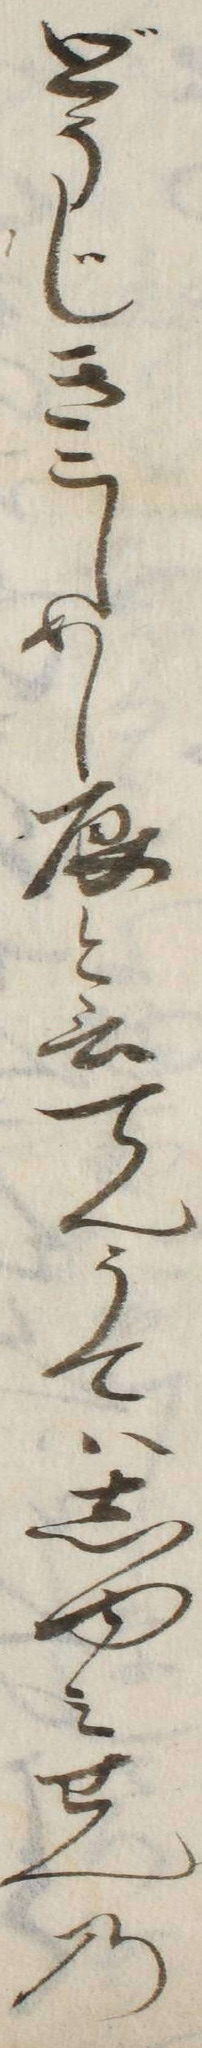どうじきこしめし辰と言てんうてはしゆみせんの
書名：奉弘法大師御傳記
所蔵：国文学研究資料館
